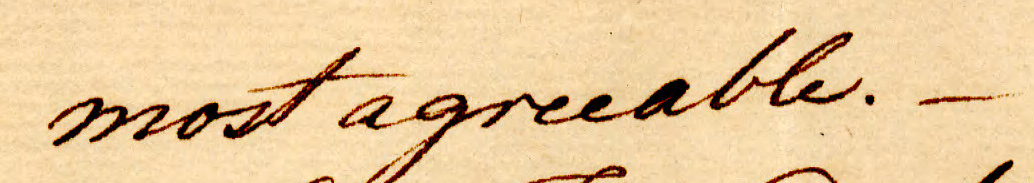most agreeable.-
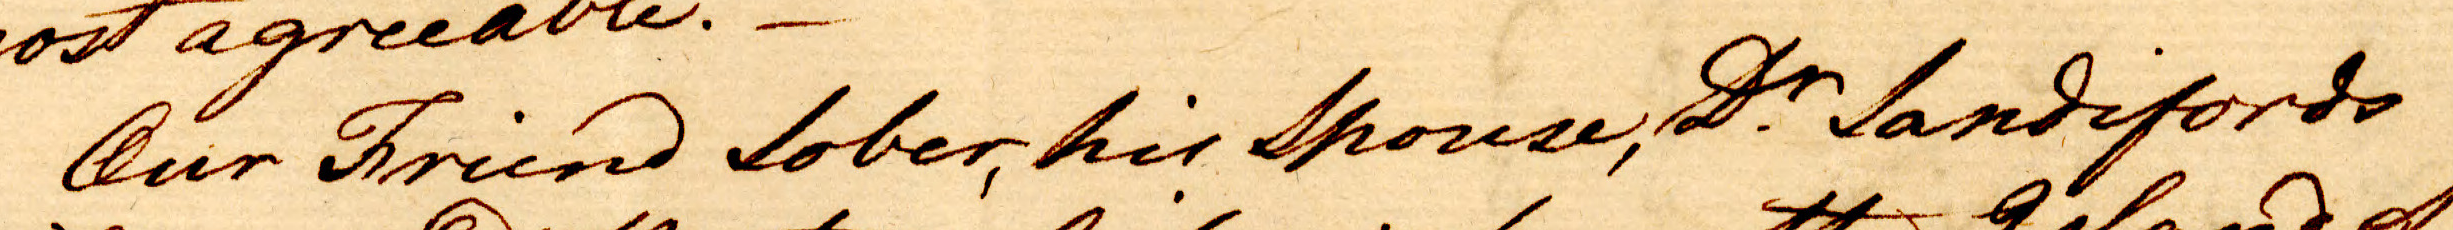Our Friend Lober, his Spouse, D^r. Landifords
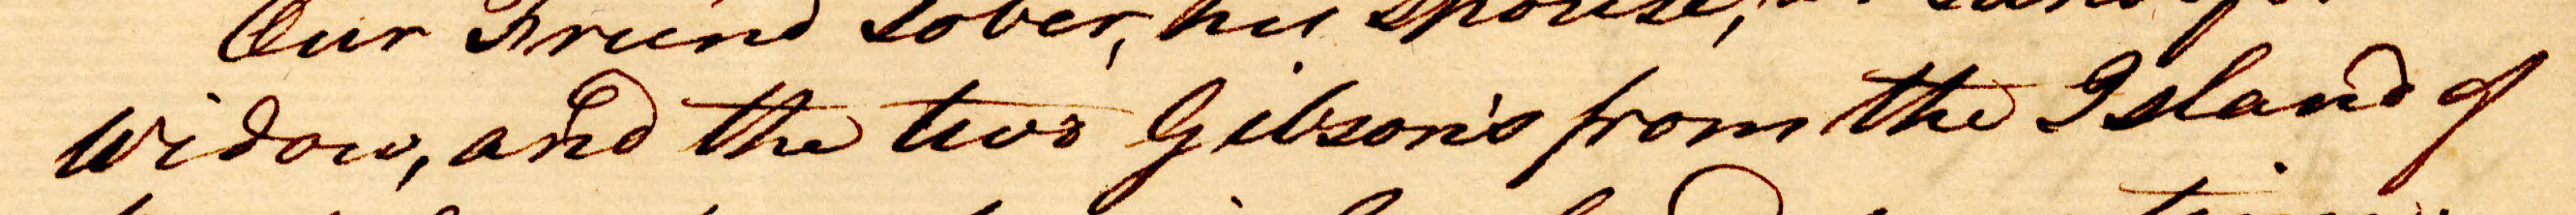widow, and the two Gibson's from the Island of
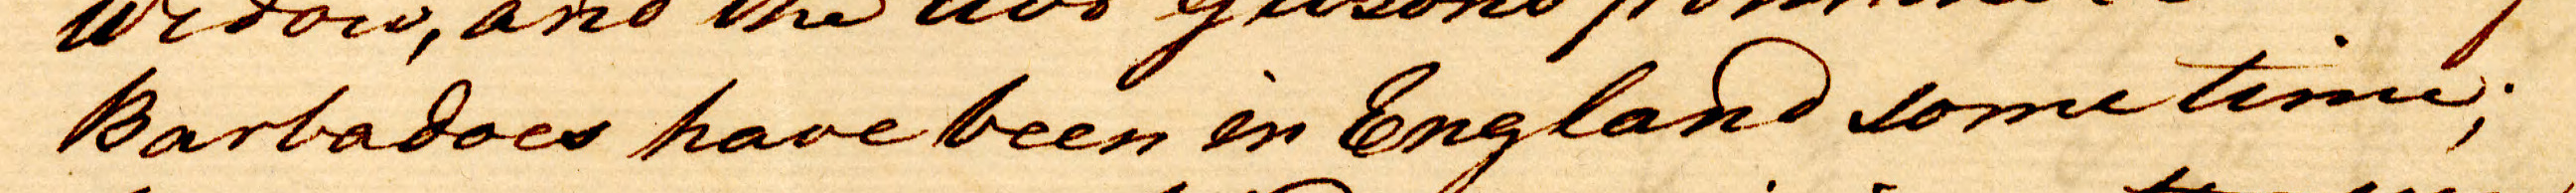Barbadoes have been in England some time;
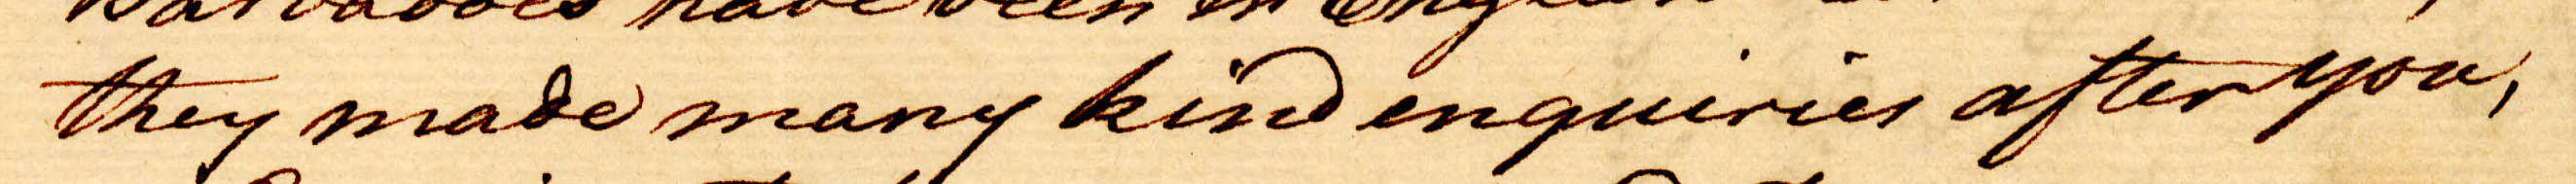they made many kind enquiries after you,
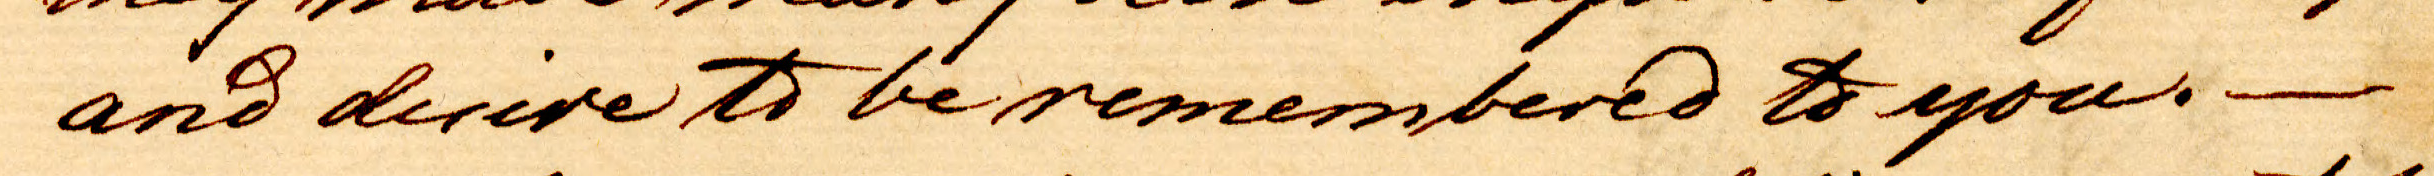and desire to be remembered to you.-
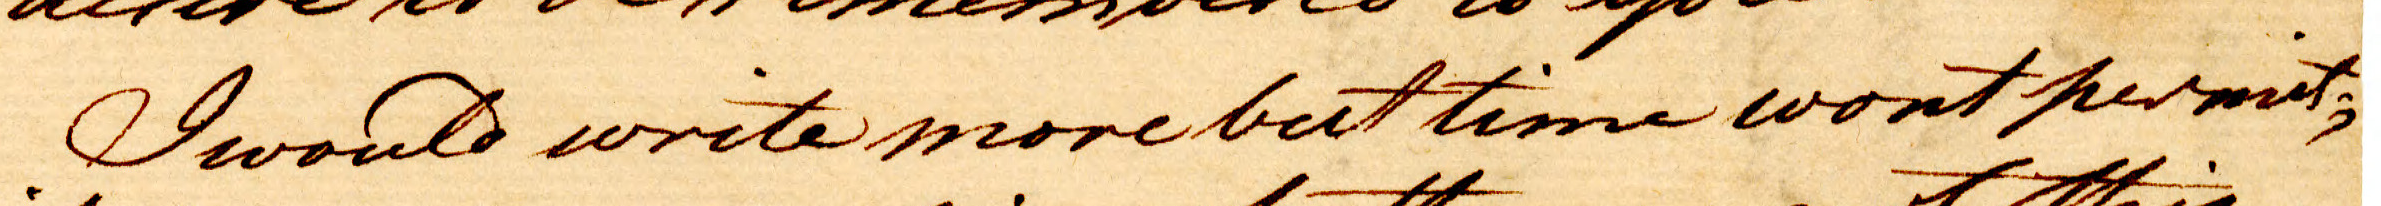I would write more but time wont permit;
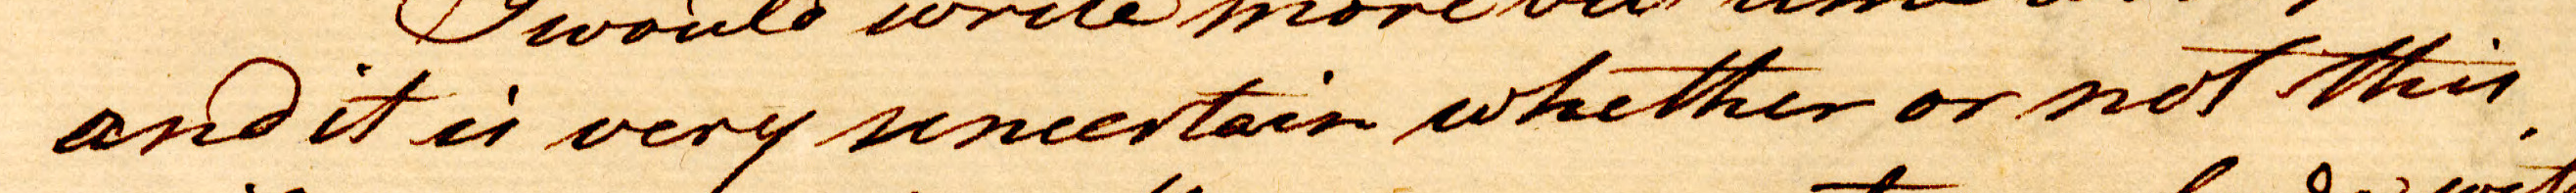and it is very uncertain whether or not this
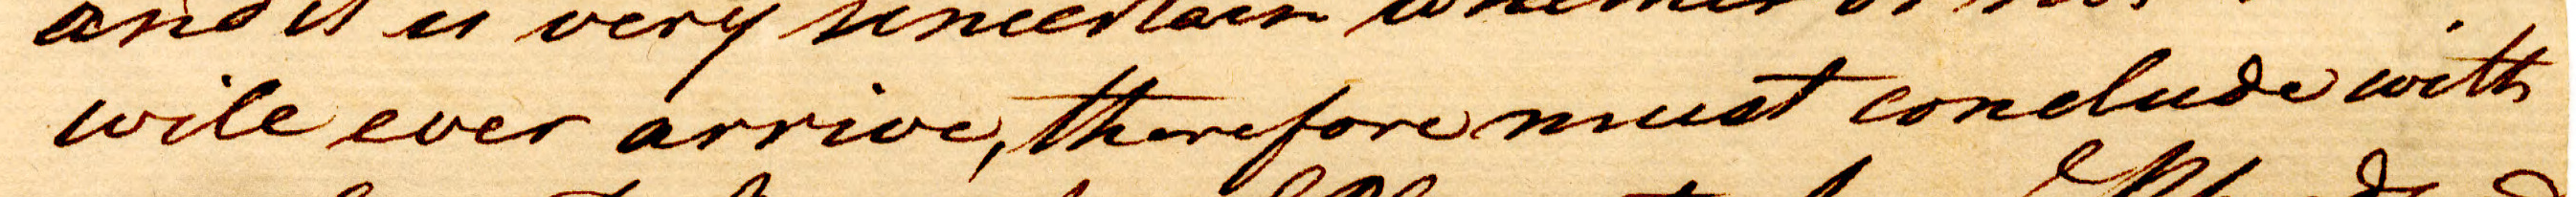will ever arrive, therefore must conclude with
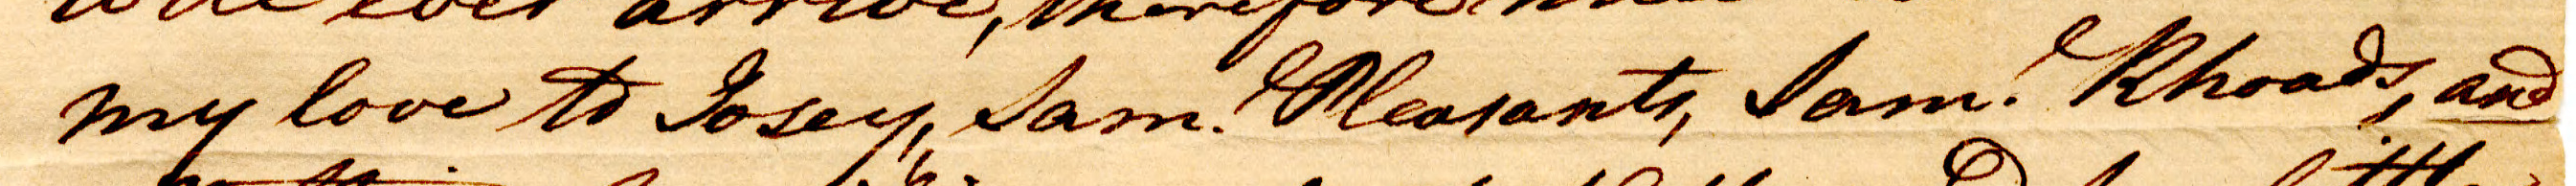my love to Josey, Sam^l Pleasants, Sam^l. Rhoads, and
